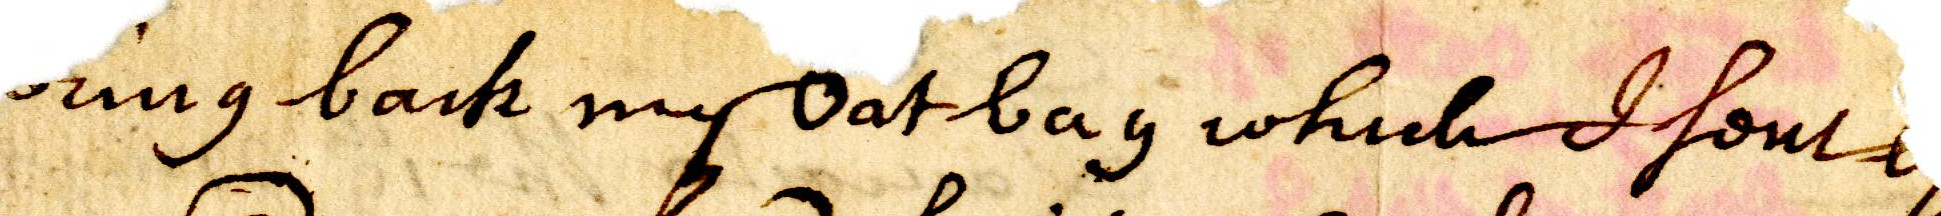bring back my Oat bag which I sent t
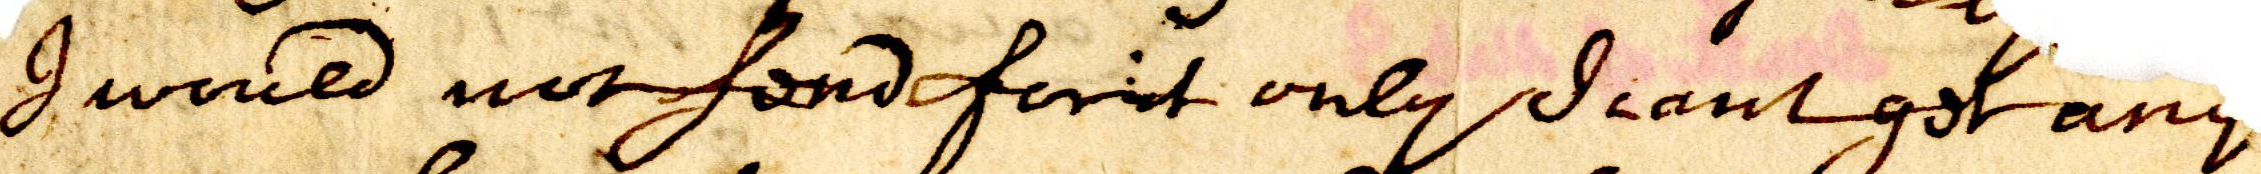I would not send for it only I cant get any
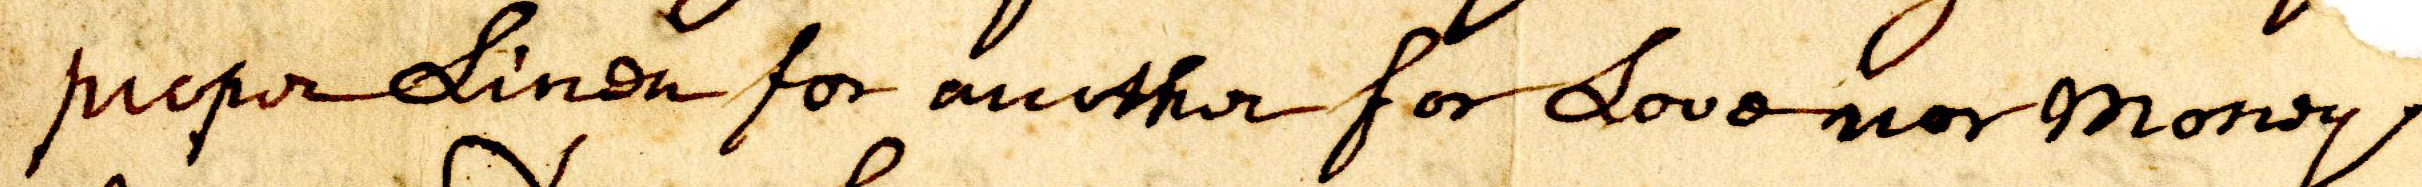proper Linen for another for Love nor Money.
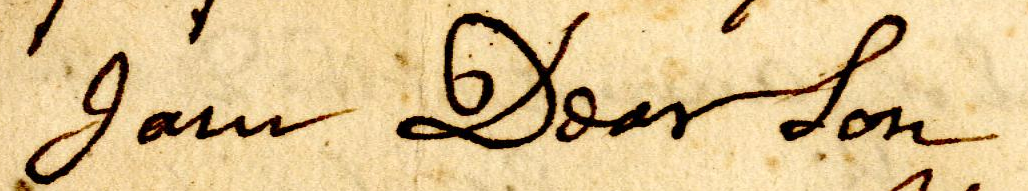I am Dear Son
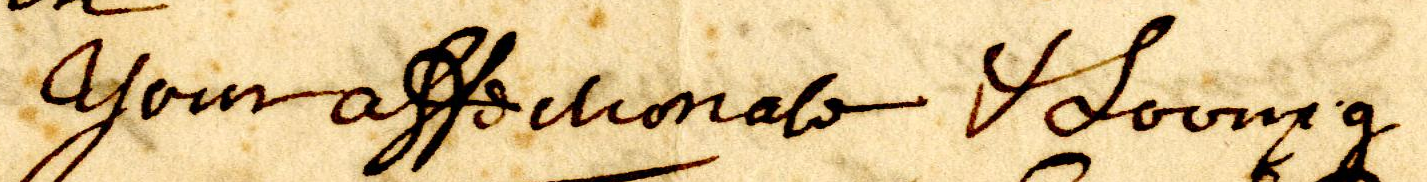Your affectionate & Loving
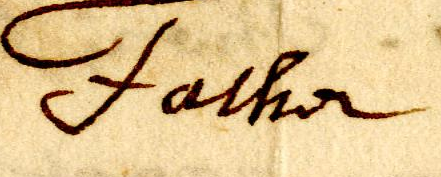Father
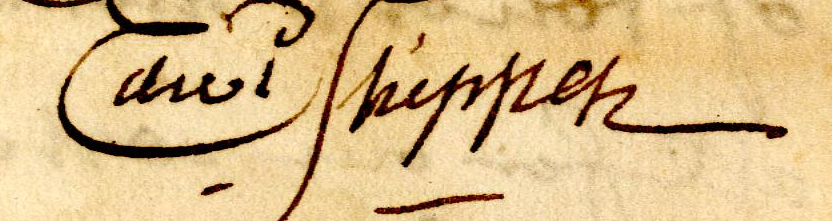Edw^d. Shippen
